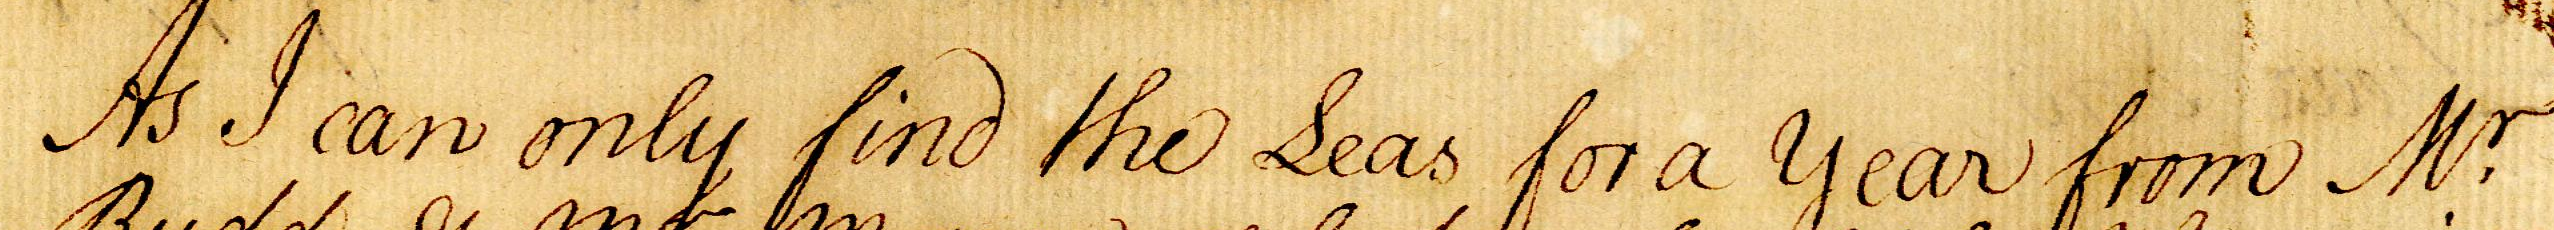As I can only find the Leas for a Year from M^r.
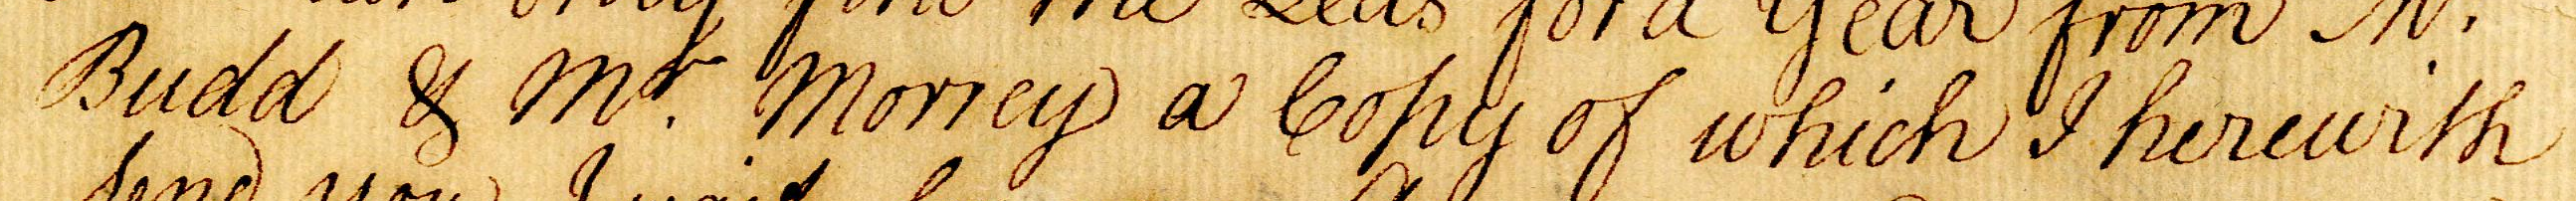Budd & M^r. Morrey a Copy of which I herewith
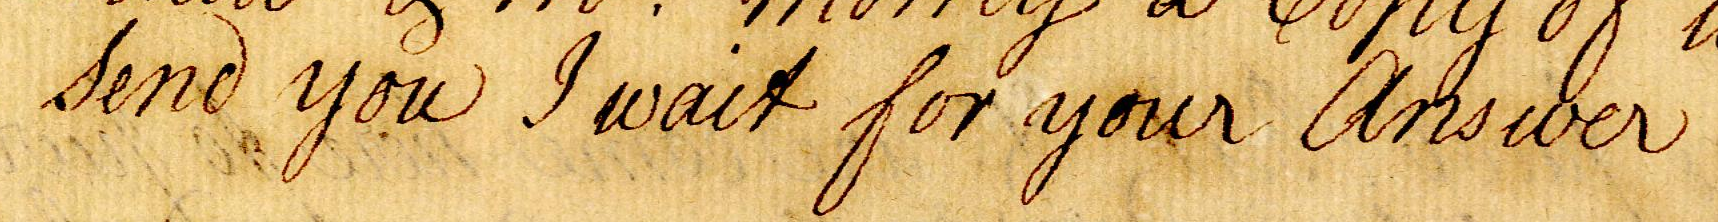send you I wait for your Answer
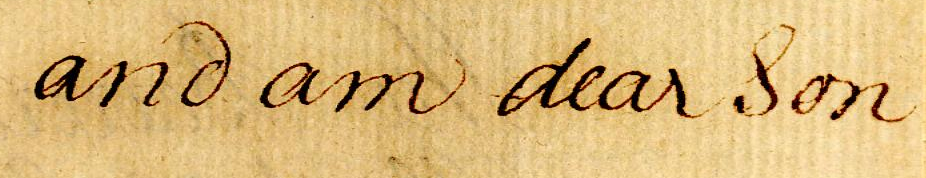and am dear Son
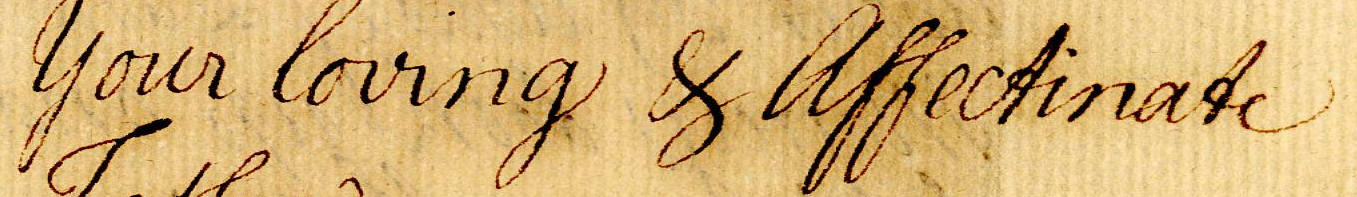Your loving & Affectinate
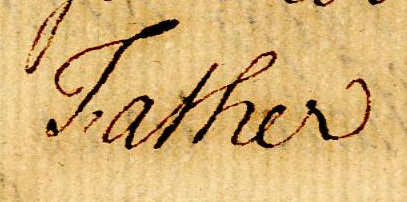Father
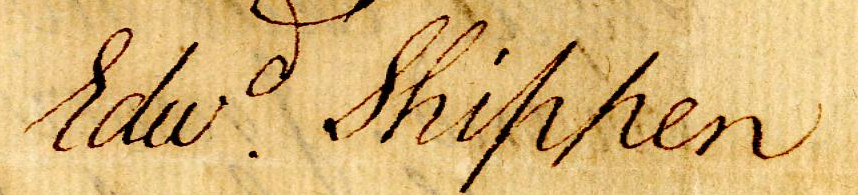Edw^d. Shippen
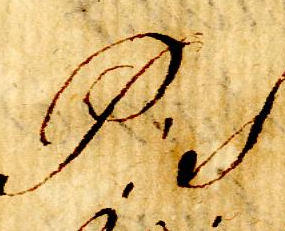P:S
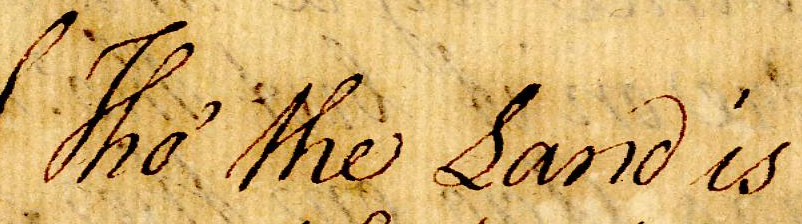Tho' the Land is
